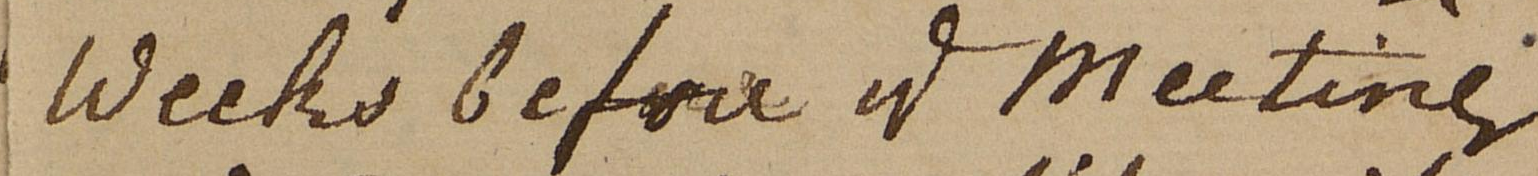Weeks before y^e Meeting
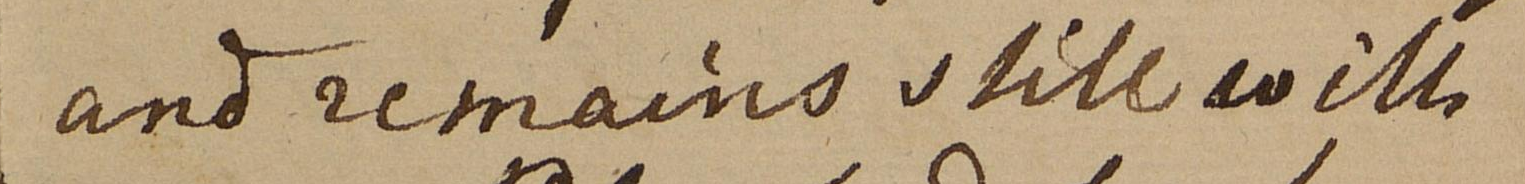and remains still with
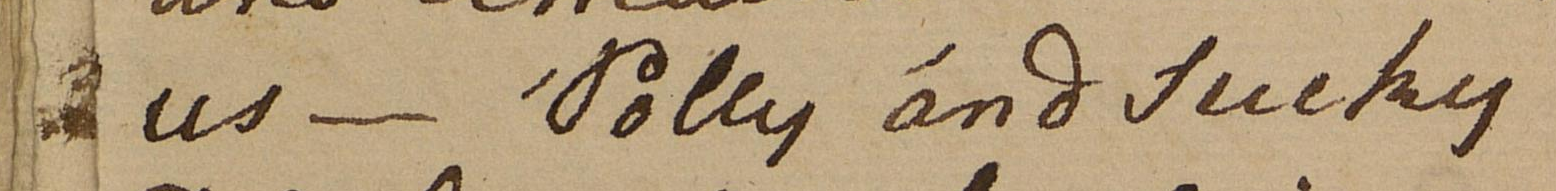us- Polly and Sueky
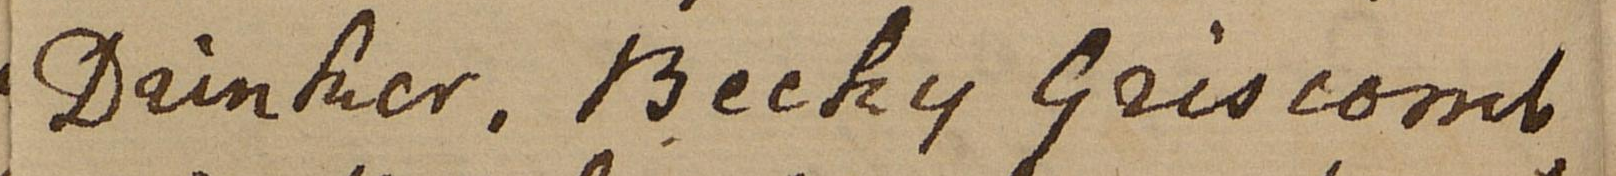Drinker, Becky Griscomb,
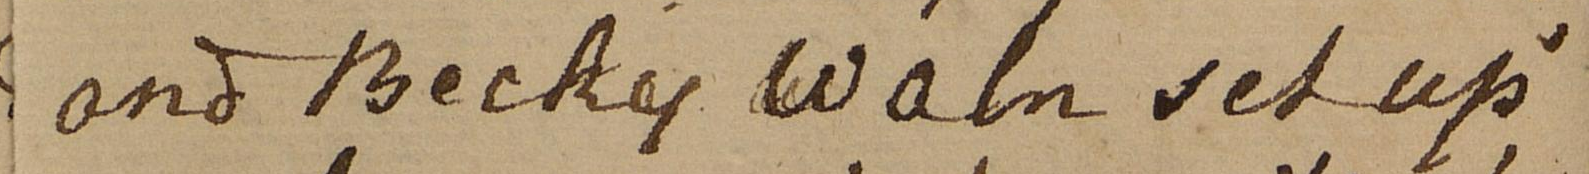and Becky Waln set up,
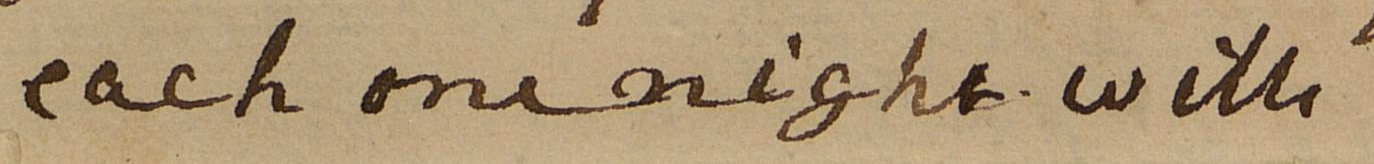each one night with
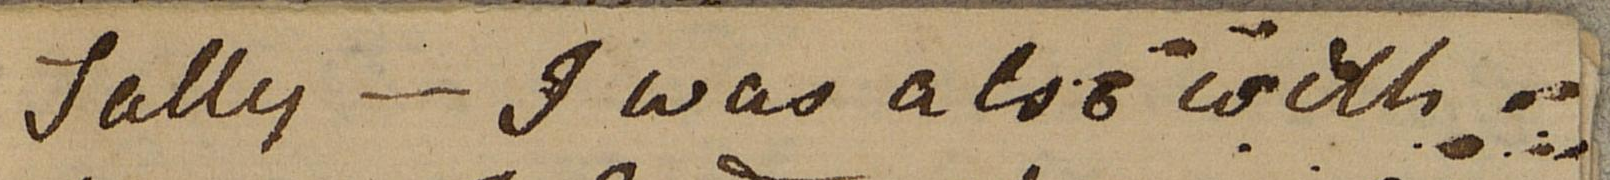Sally- I was also with
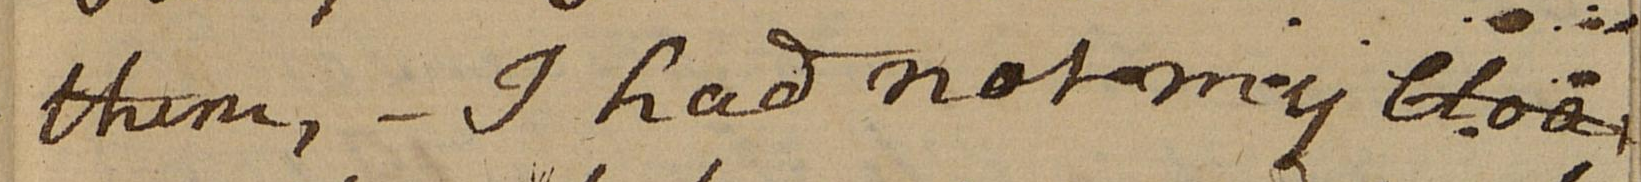them,- I had not my [Cloa]
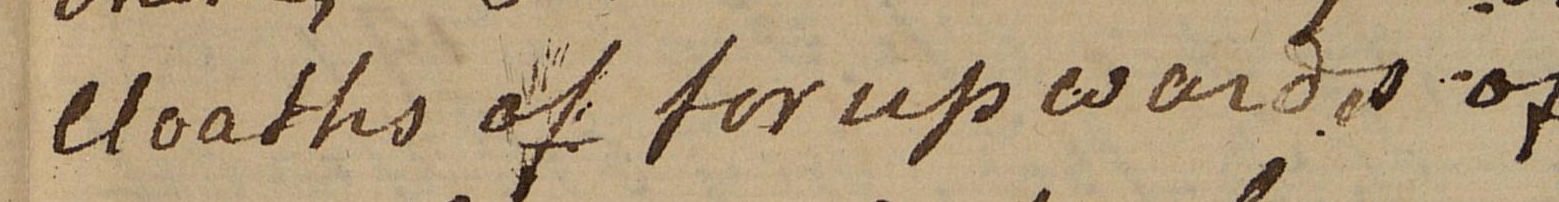Cloaths of for upwards of
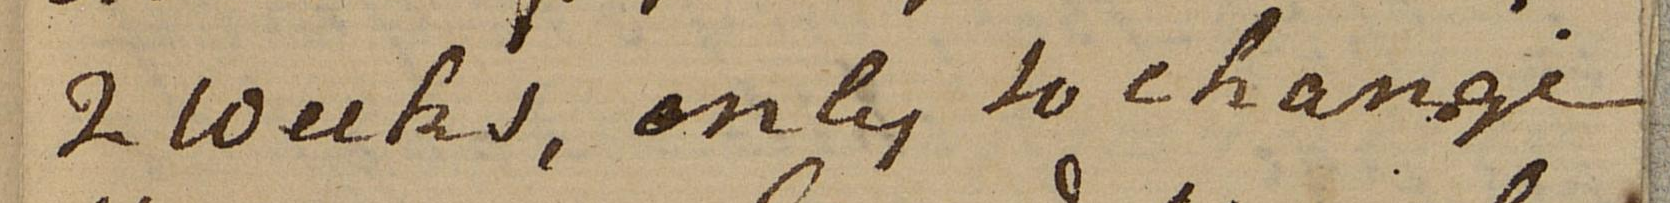2 weeks, only to change
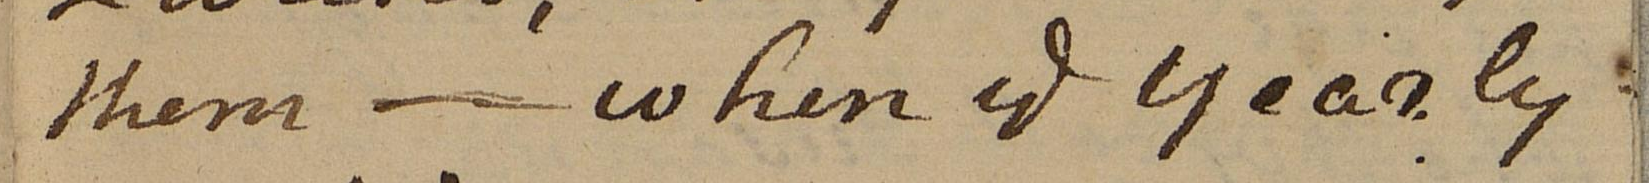them- when y^e yearly
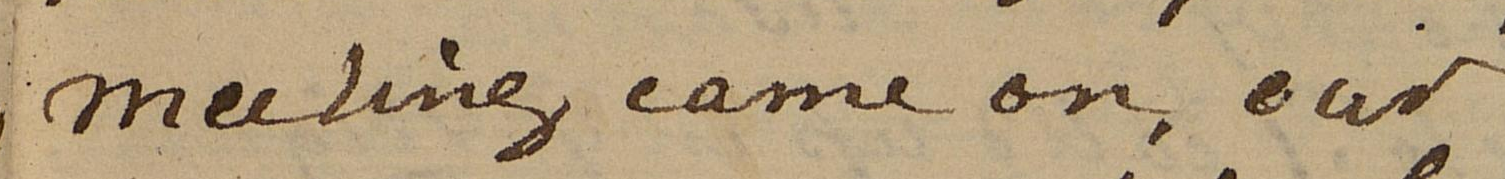meeting came on, our
